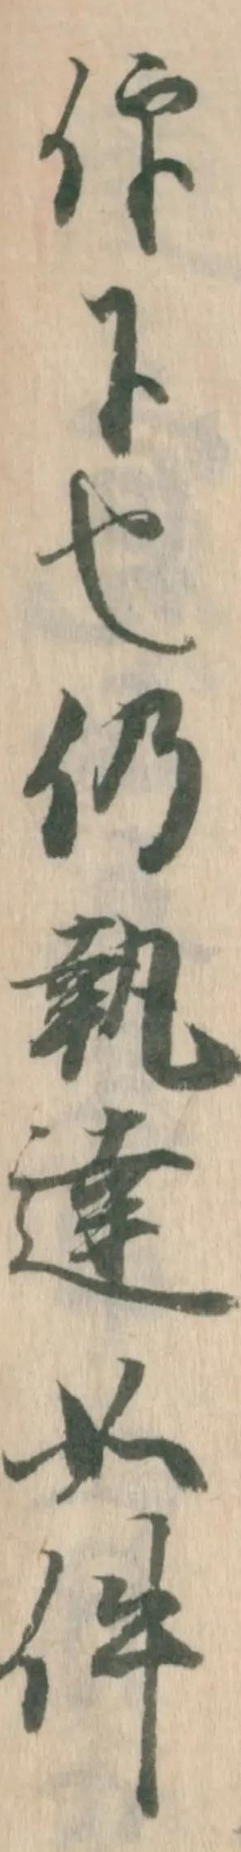仰下也仍執達如件

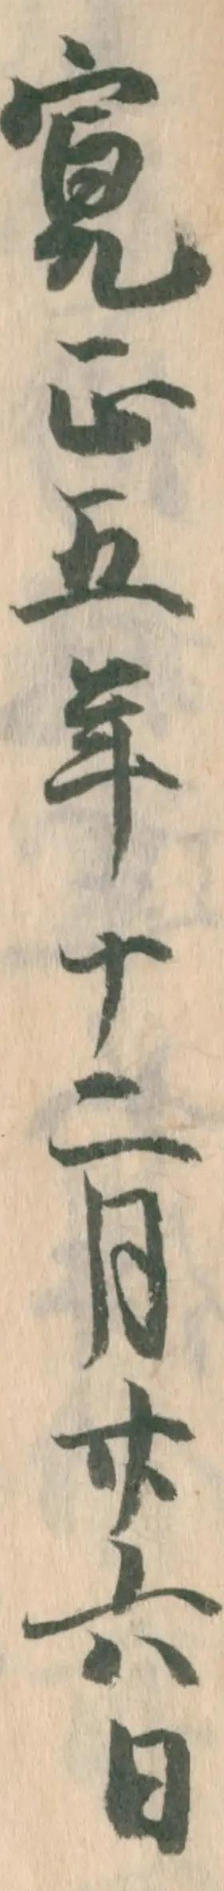寛正五年十二月廿六日
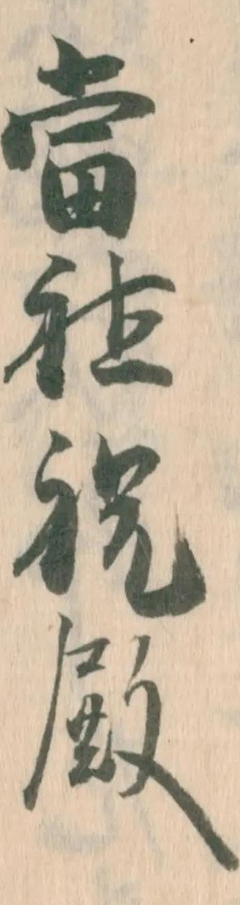当社祝殿
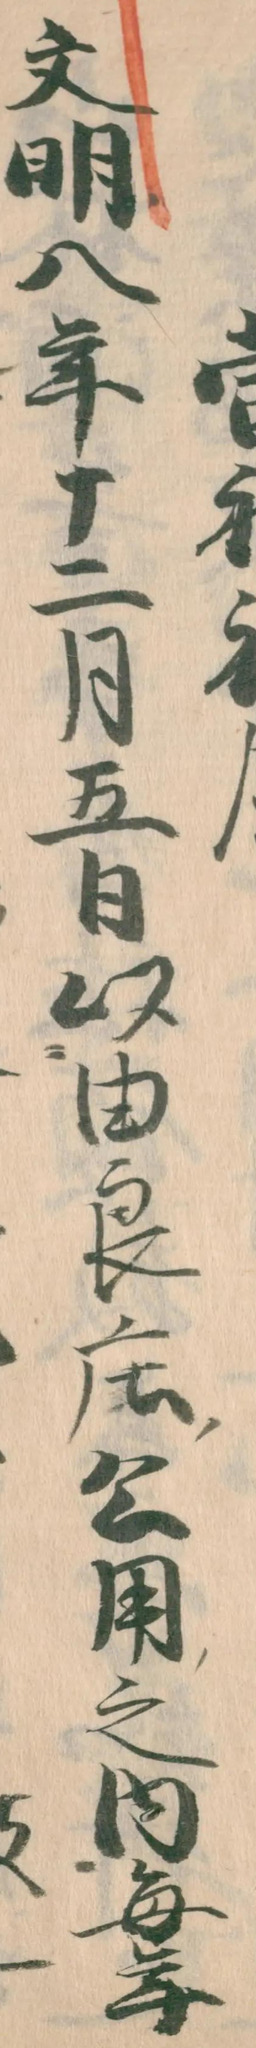文明八年十二月五日以由良庄公用之内毎年
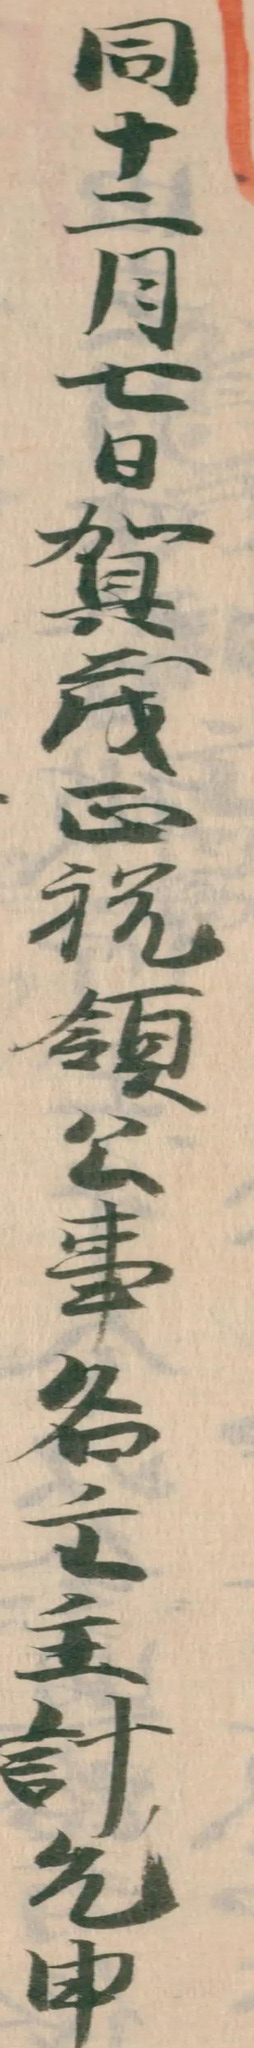同十二月七日賀茂正祝領公事名主主計允申
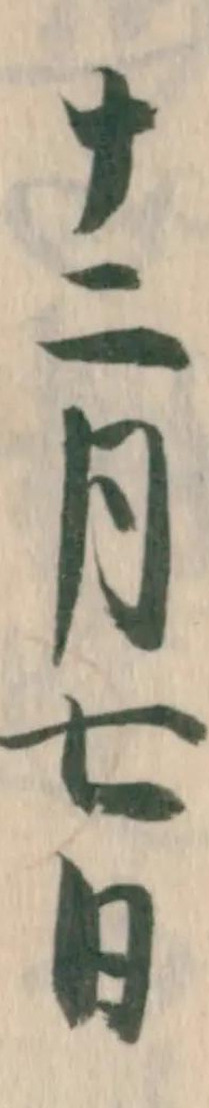十二月七日
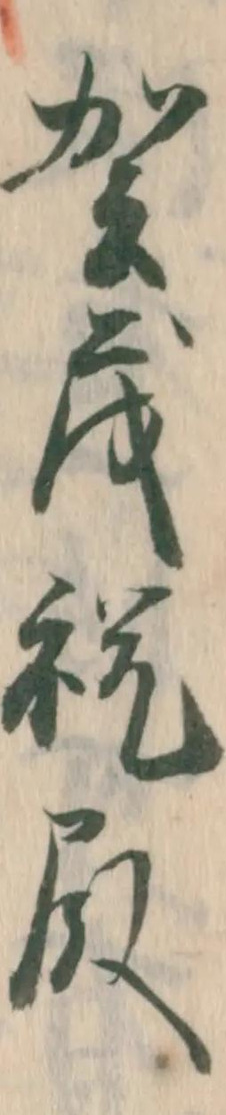賀茂祝殿

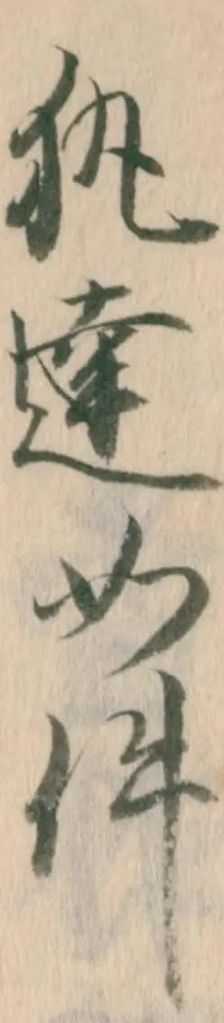執達如件
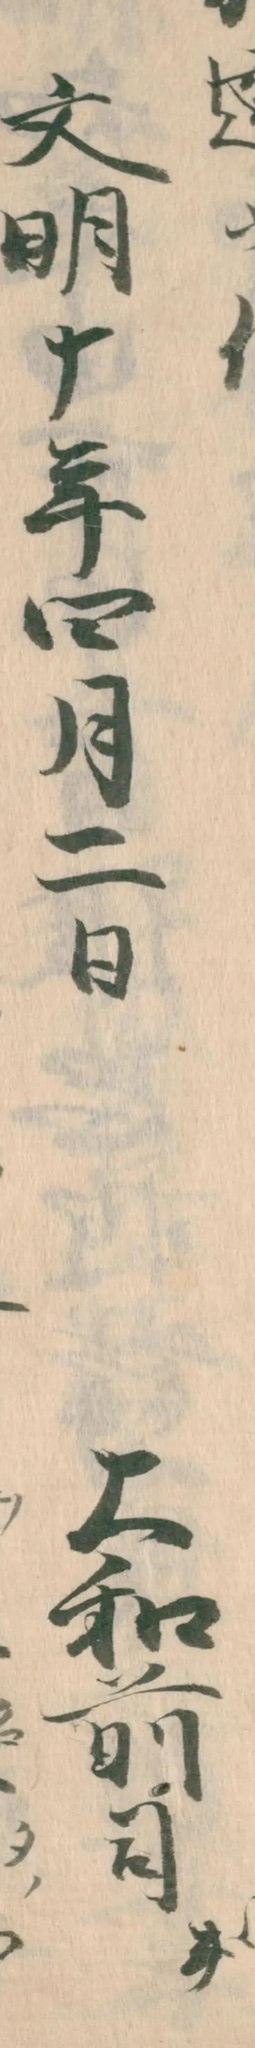文明十年四月二日大和前司判々
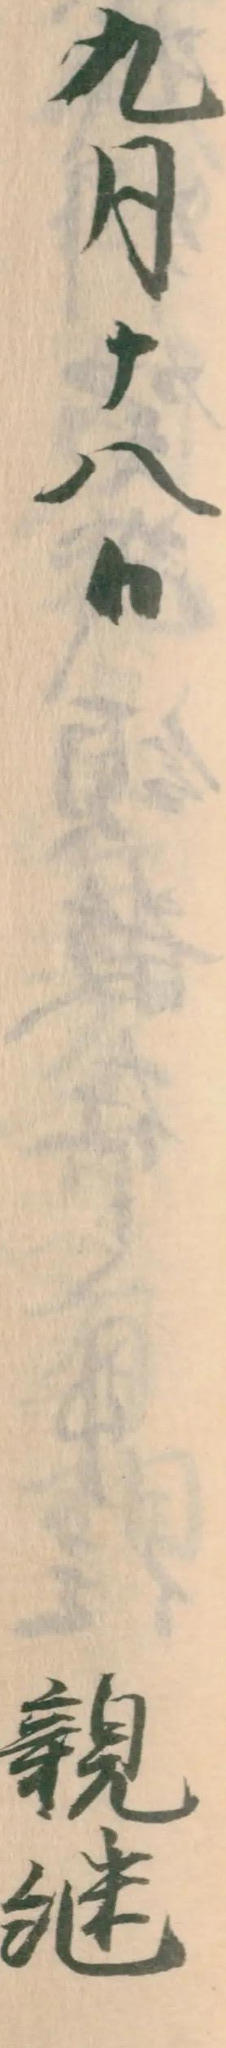九月十八日親継
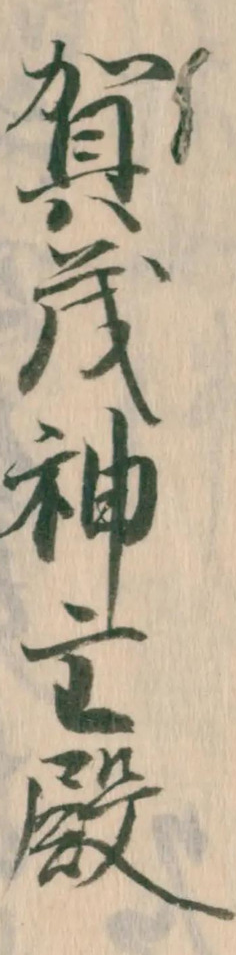賀茂神主殿
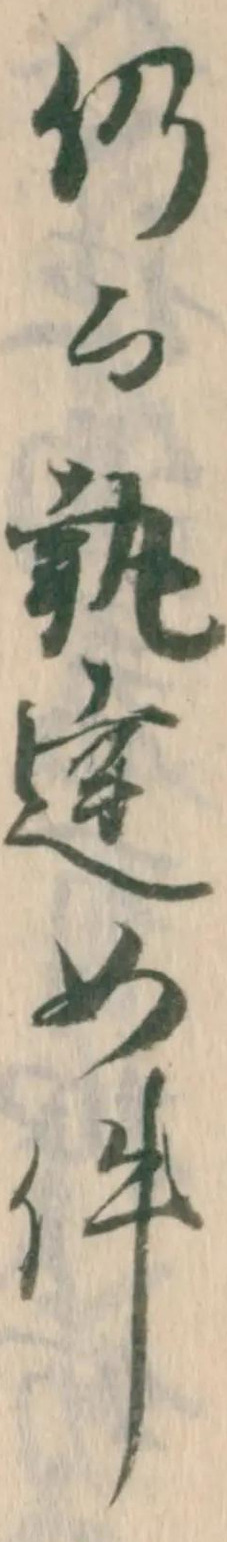仍而執達如件
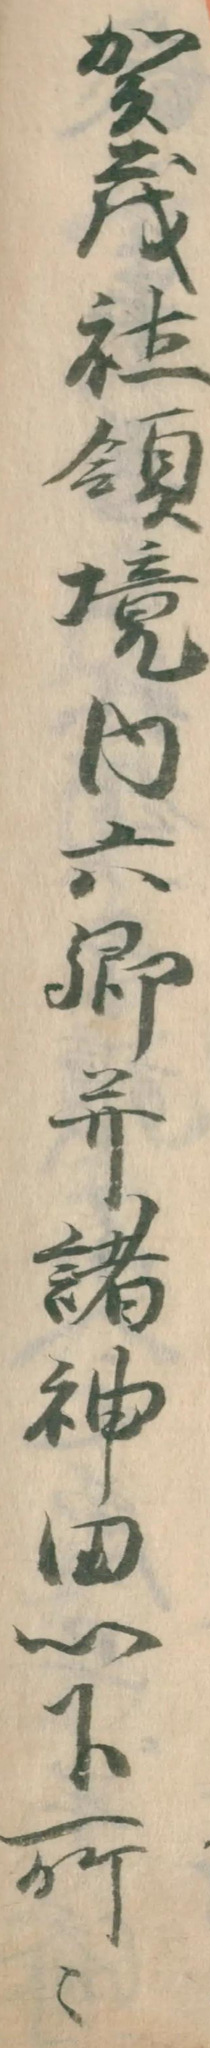賀茂社領境内六郷并諸神田以下所々

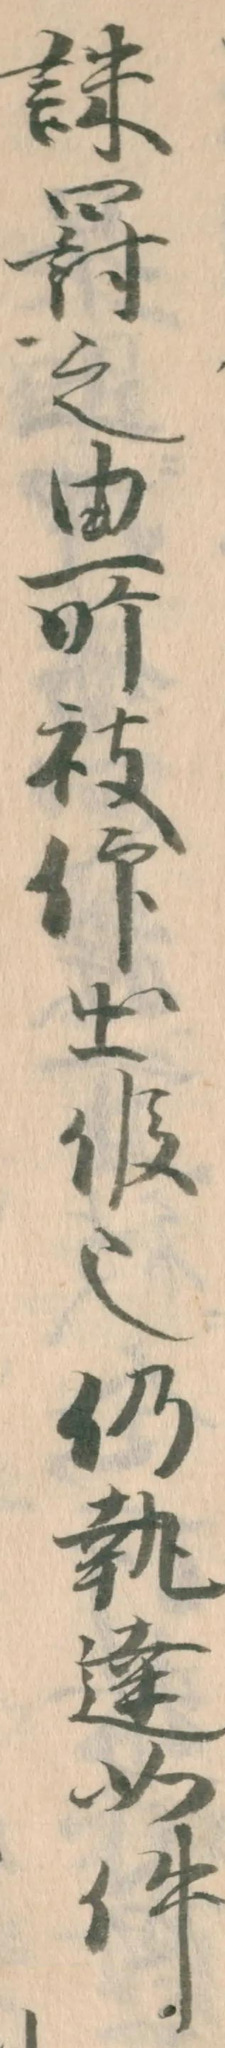誅罰之由所被仰出候也仍執達如件
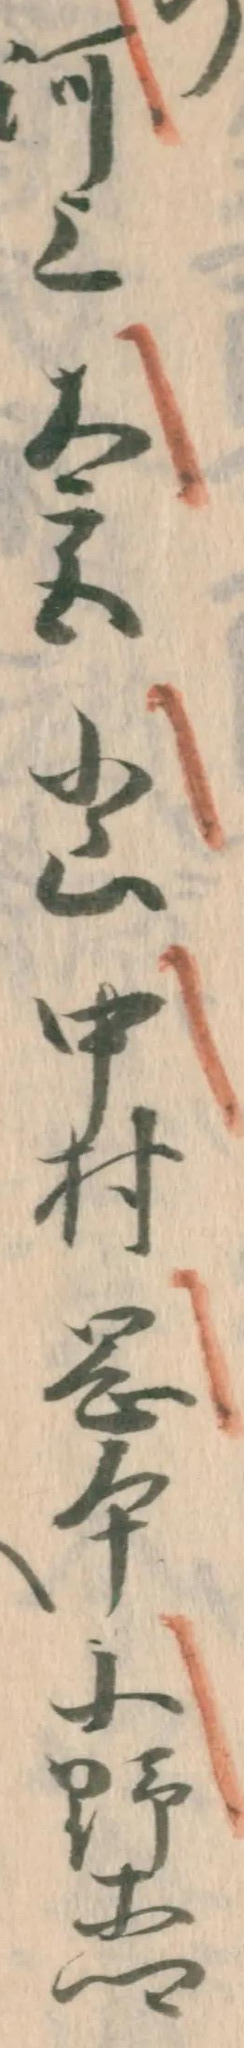河上大宮小山中村岡本小野等郷
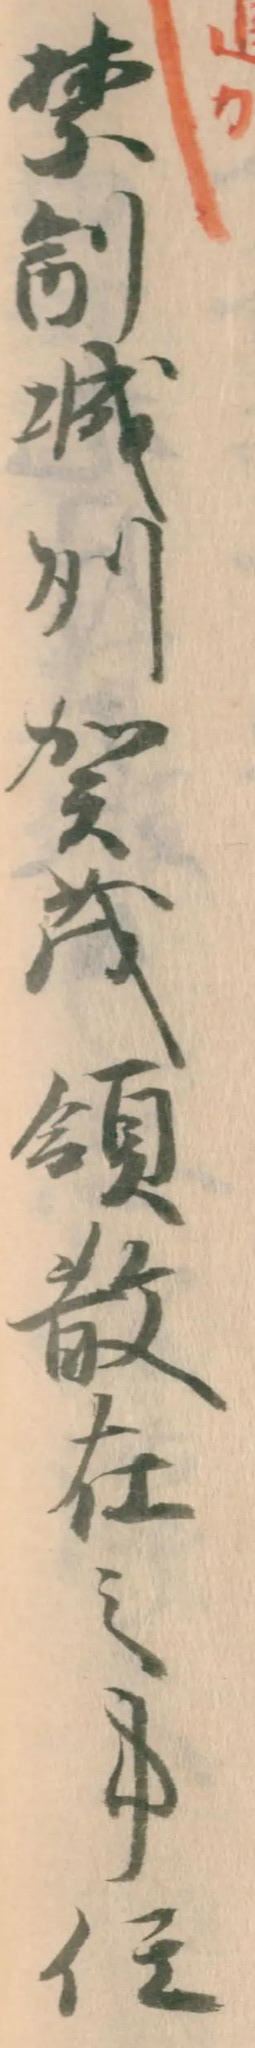禁制城州賀茂領散在之事任
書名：賀茂社記録. 第1冊
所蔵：国立国会図書館 National Diet Library, JAPAN
